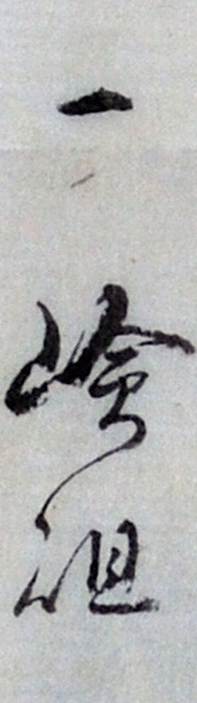一嶮岨
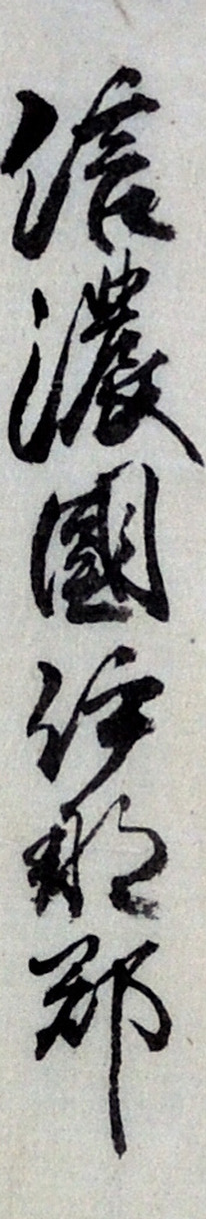信濃国伊那郡
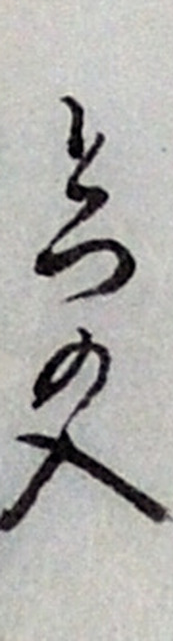とつの入
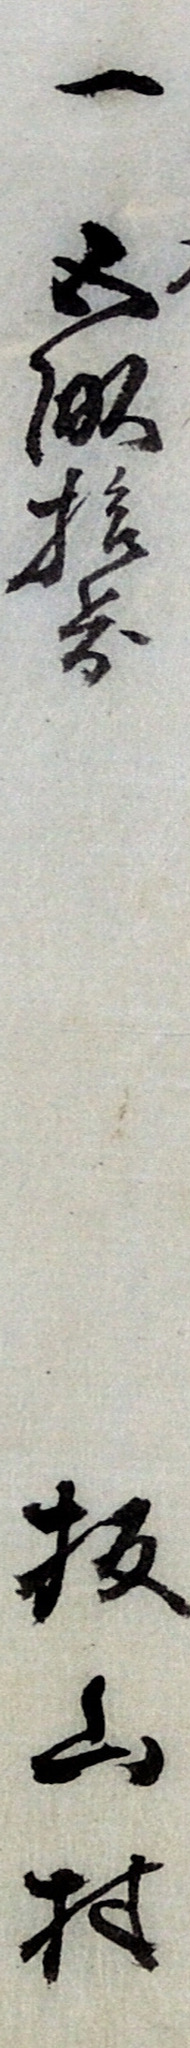一五㽗拾歩板山村
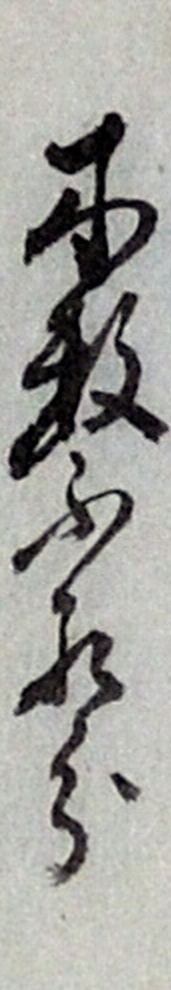木数不相分
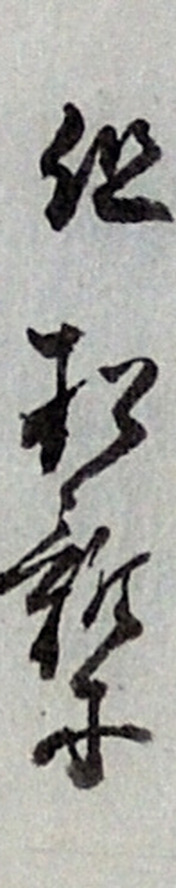但松雑木
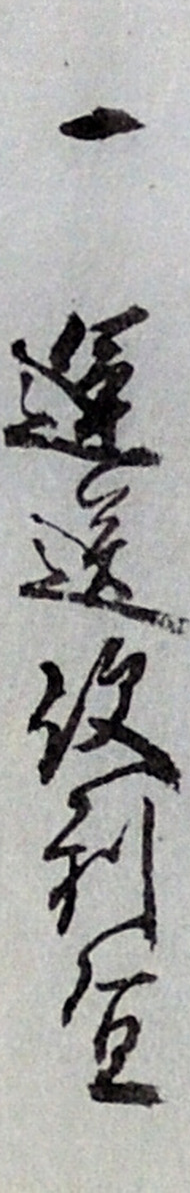一運送便利宜
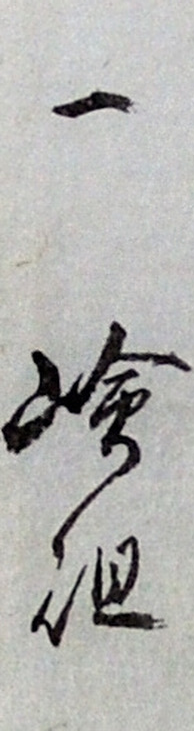一嶮岨

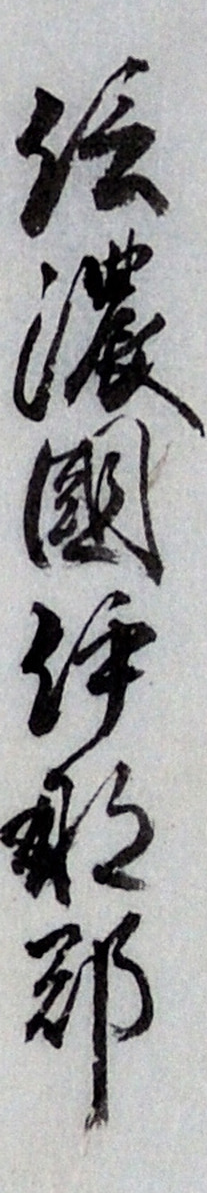信濃国伊那郡
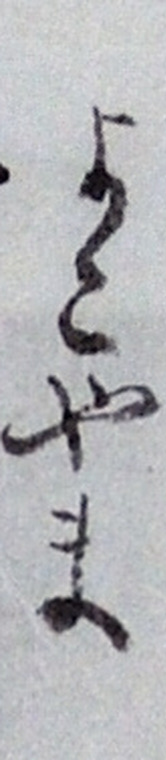よこやま
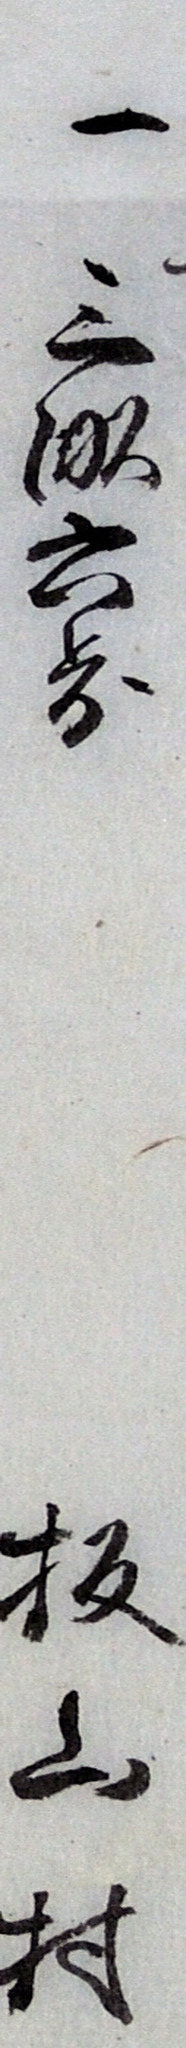一三㽗六歩板山村
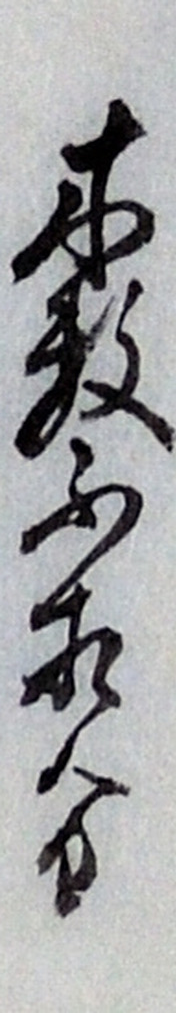木数不相分
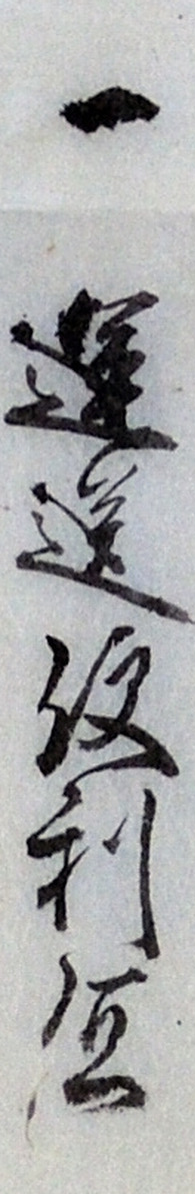一運送便利宜
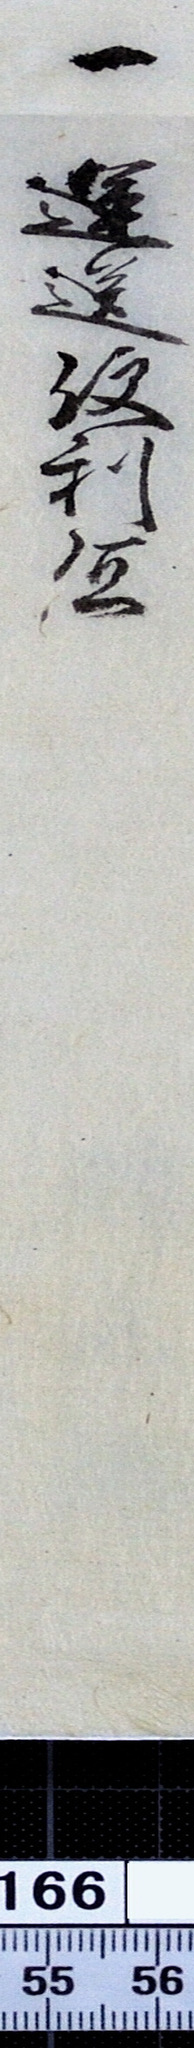一運送便利宜
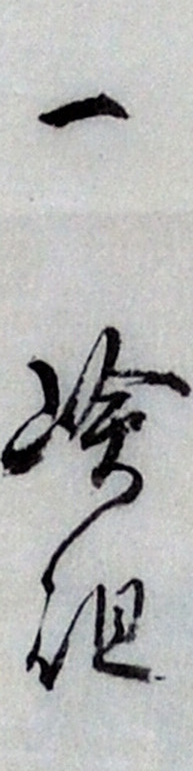一嶮岨
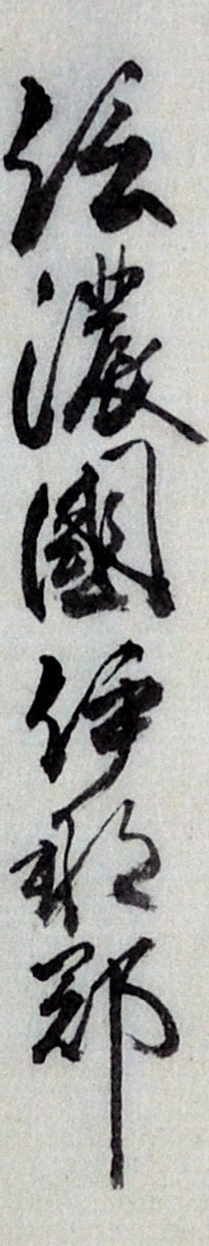信濃国伊那郡
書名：官林反別帳
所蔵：伊那市立高遠町図書館・合同会社AMANE
